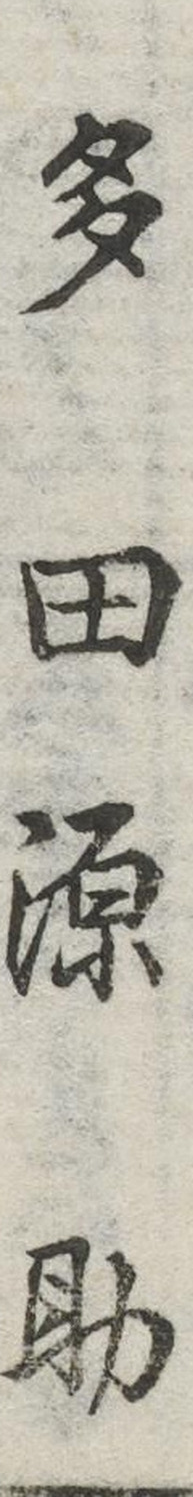多田源助
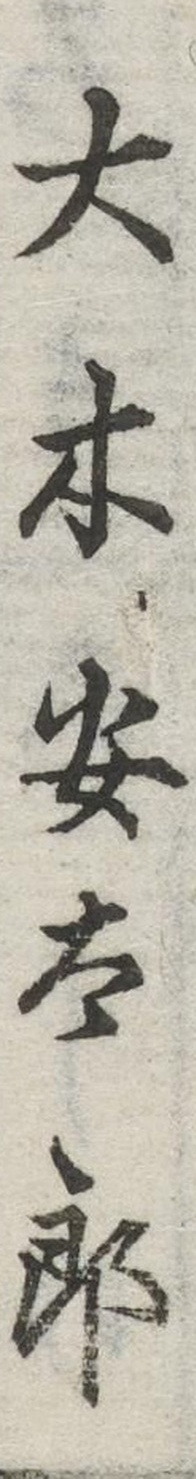大木安太郎
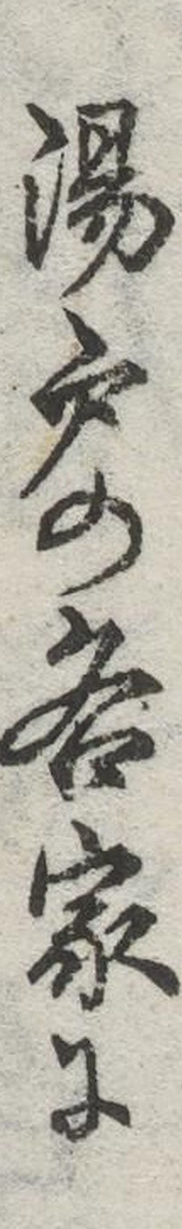湯戸の各家に
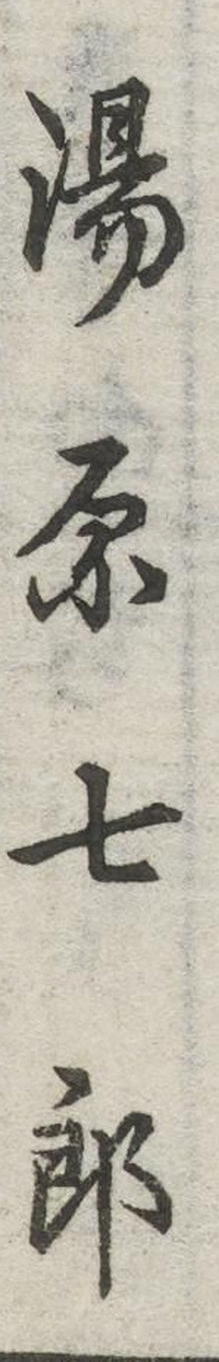湯原七郎
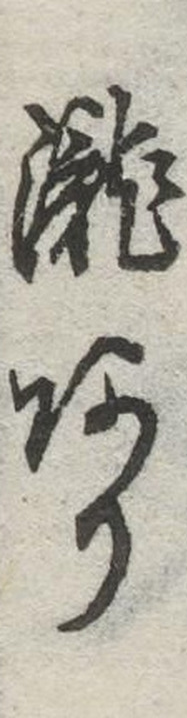瀧あり

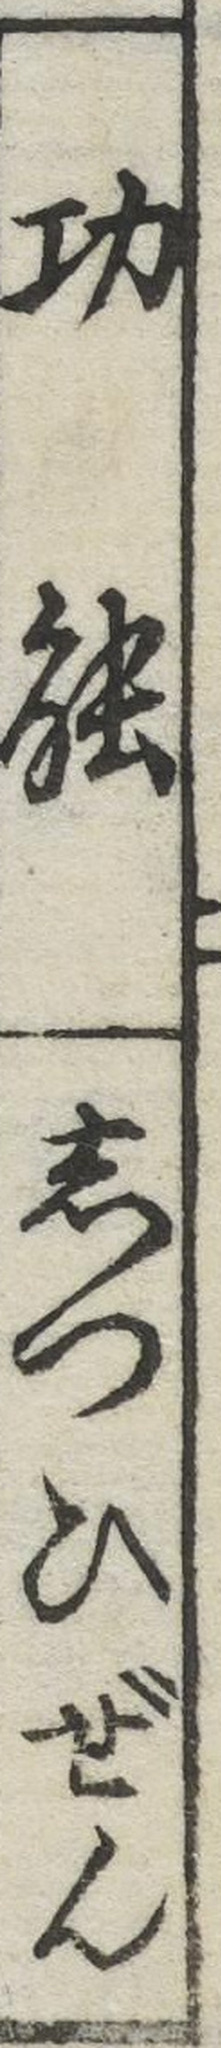功能しつひぜん
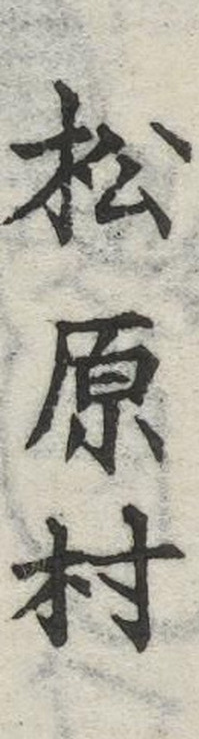松原村
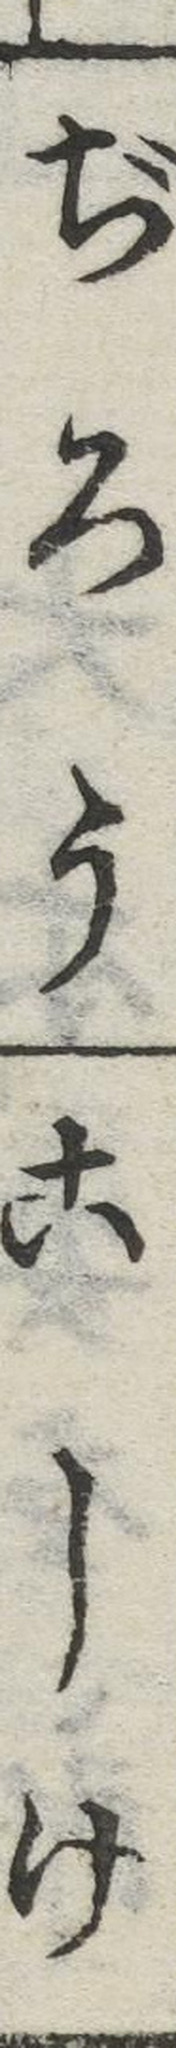ぢろうこしけ
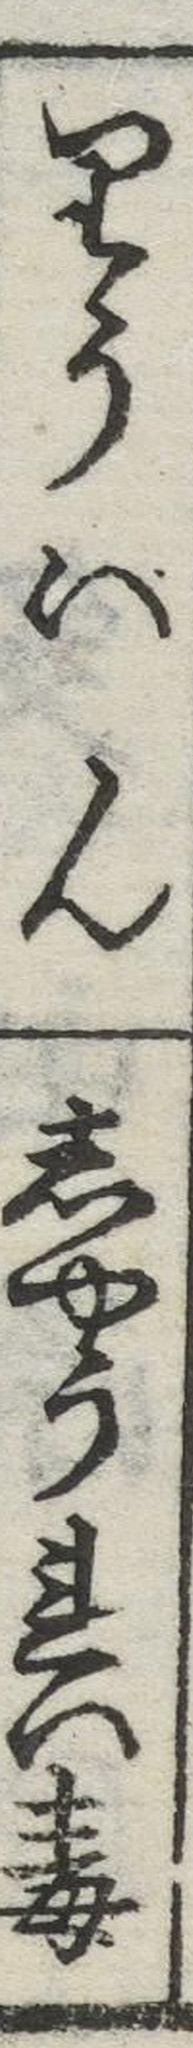りういんしやうれい毒
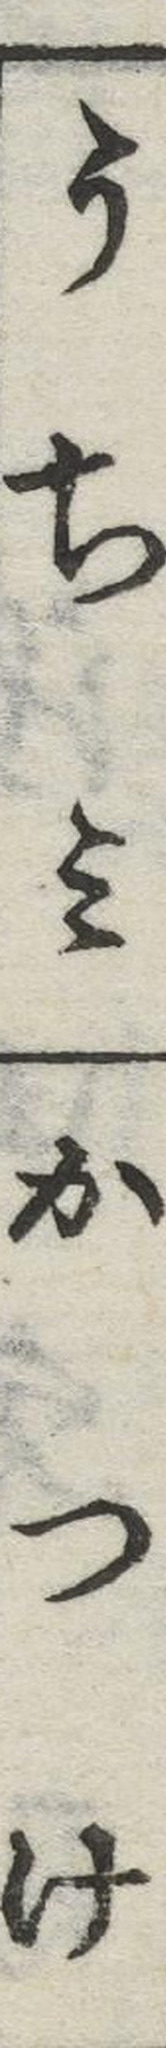うちみかつけ
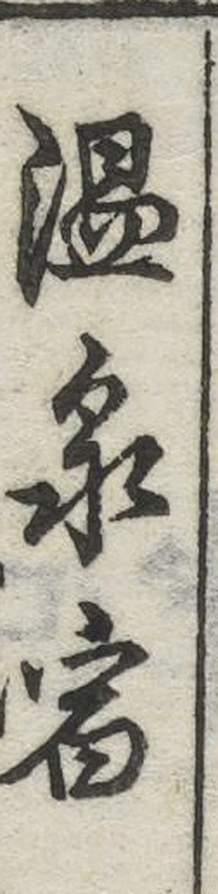温泉宿
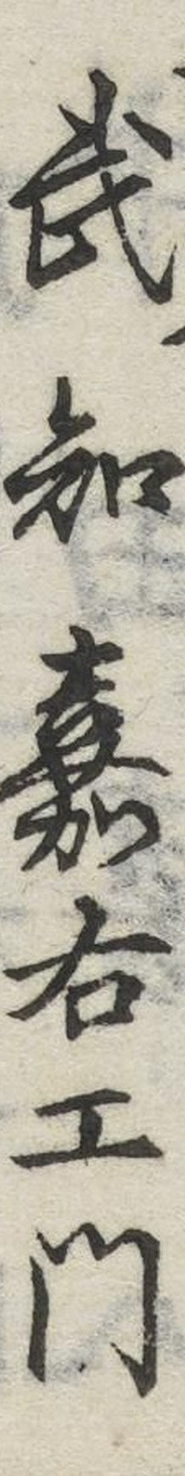武知嘉右エ門
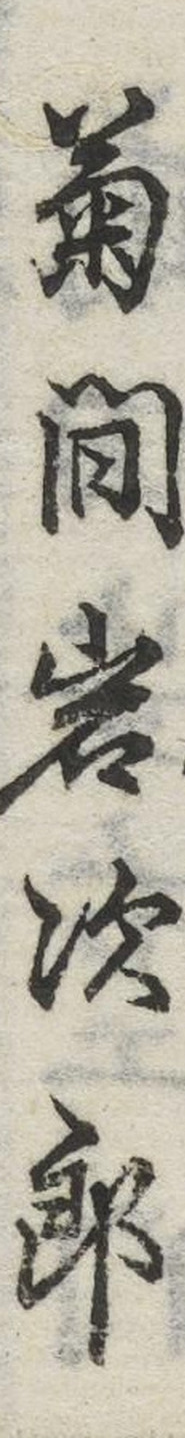菊間岩次郎
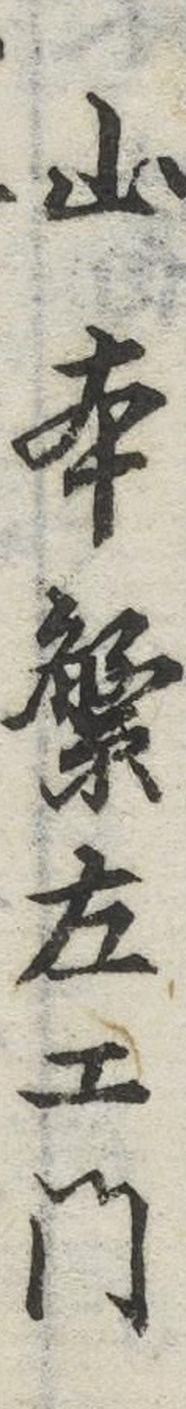山本繁左エ門
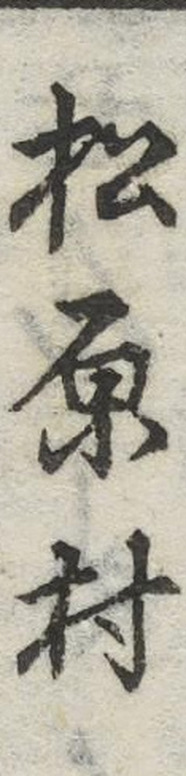松原村
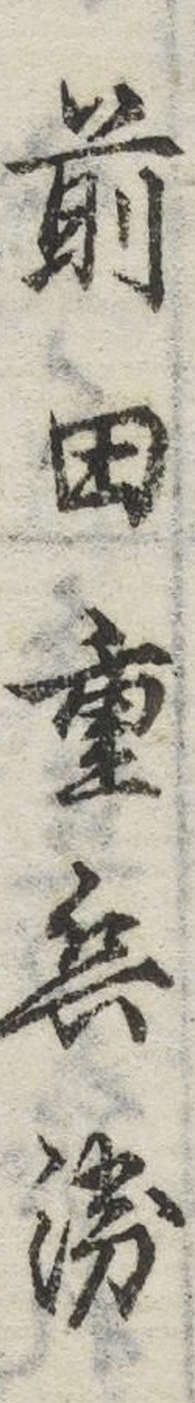前田重兵衛
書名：諸國温泉遊覽記　全
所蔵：東京大学地震研究所図書室 Earthquake Research Institute Library, The University of Tokyo, JAPAN
